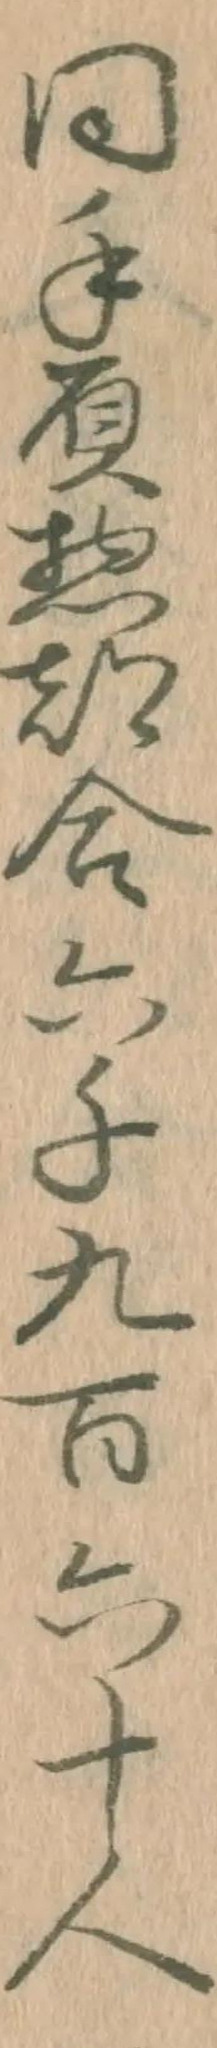同手負惣都合六千九百六十人
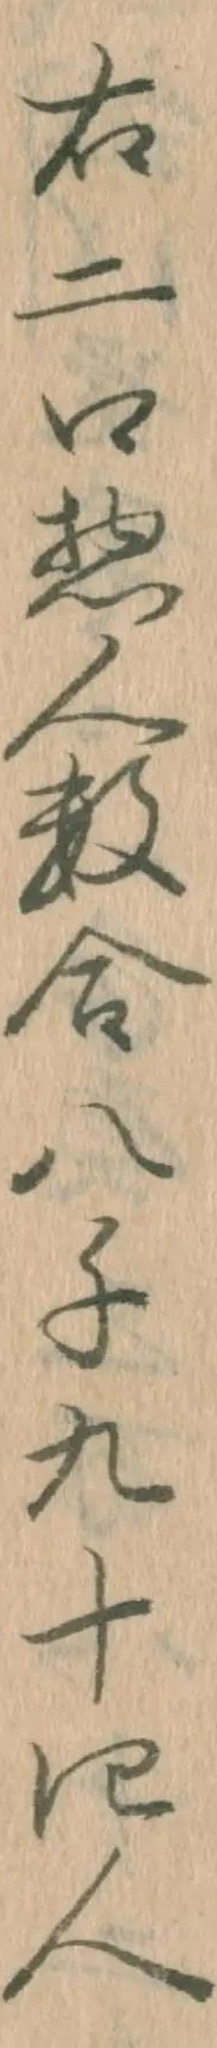右二口惣人数合八千九十四人
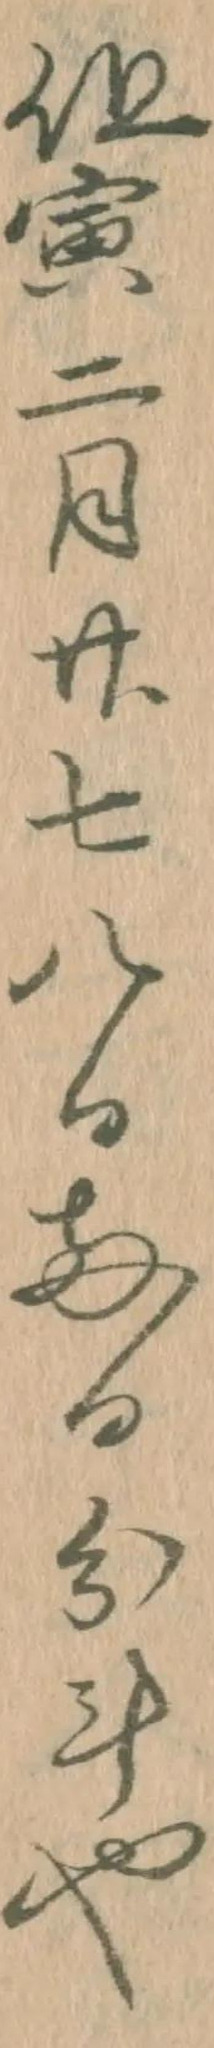但寅二月廿七八日両日分斗也
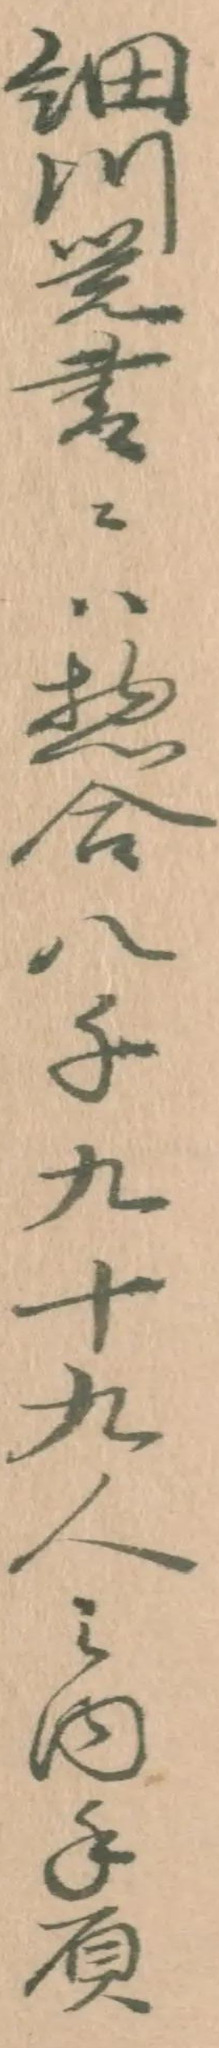細川覚書には惣合八千九十九人之内手負
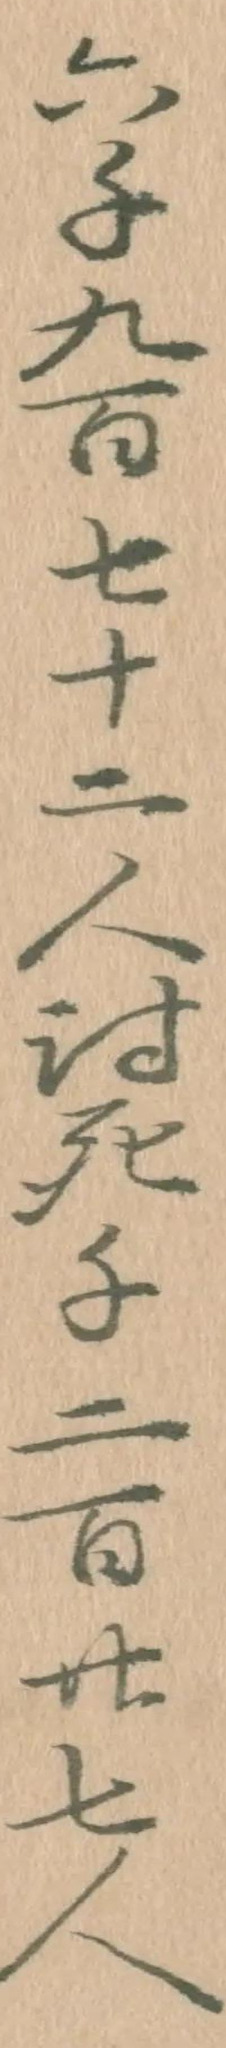六千九百七十二人討死二百廿七人
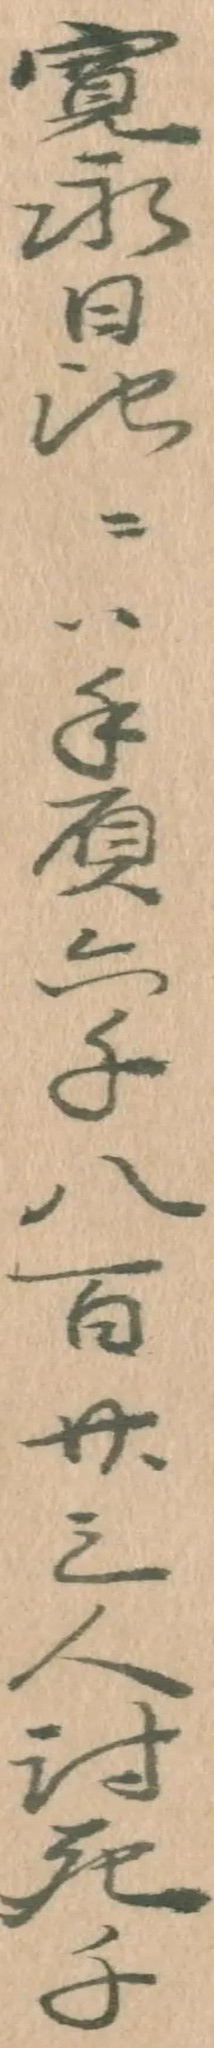寛永日記には手負六千八百廿三人討死千
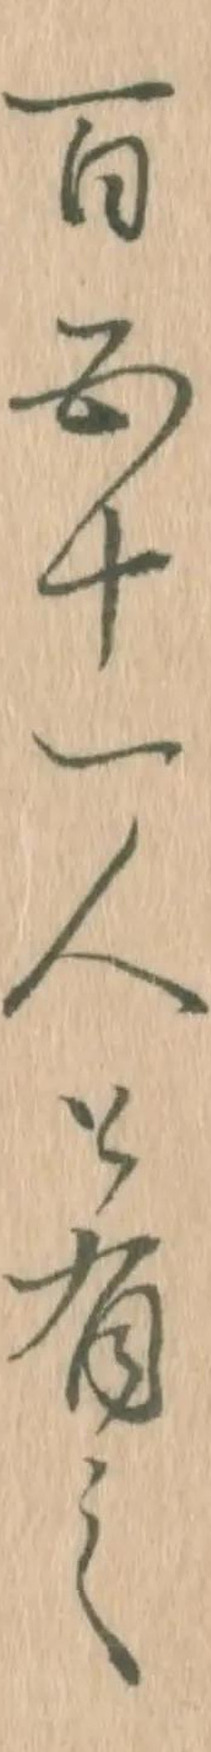百五十一人と有之

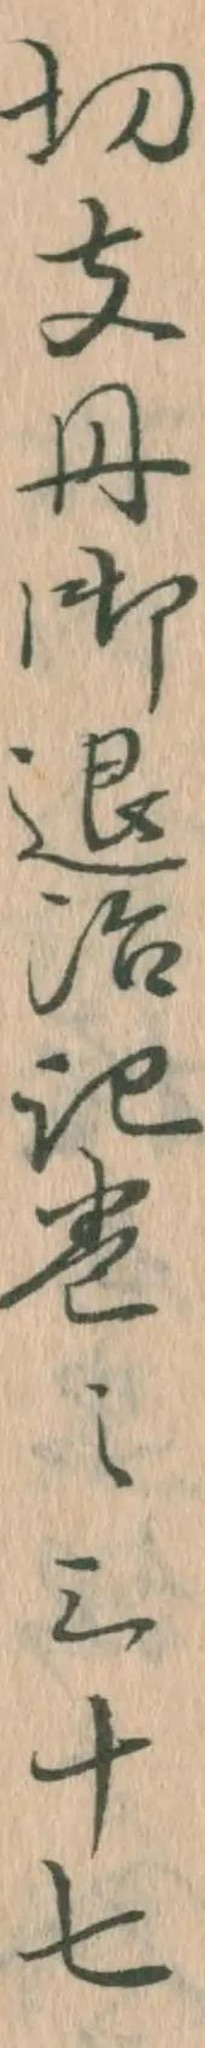切支丹御退治記巻之三十七
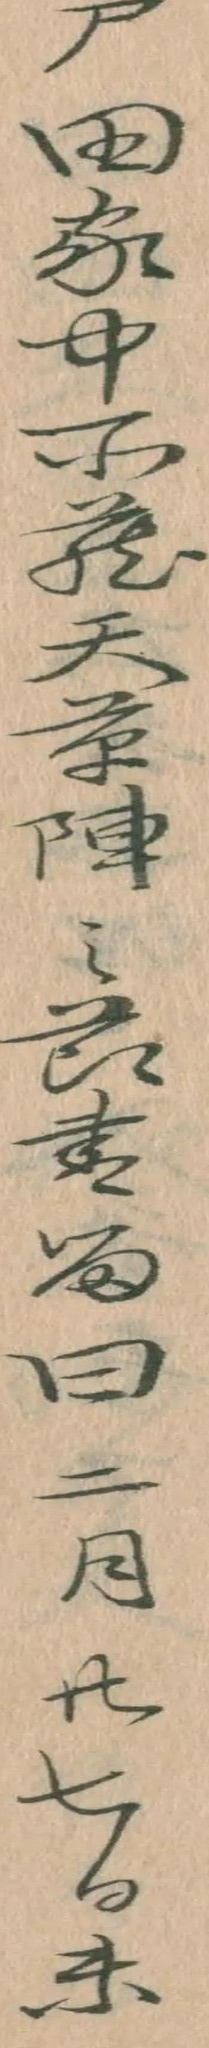戸田家中所蔵天草陣之節書留曰二月廿し七日未
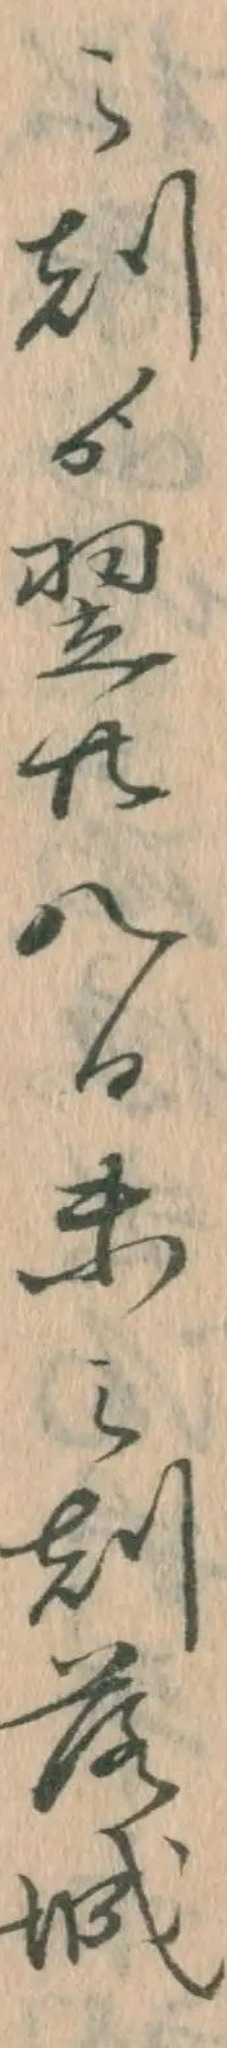之刻ゟ翌廿八日未之刻落城
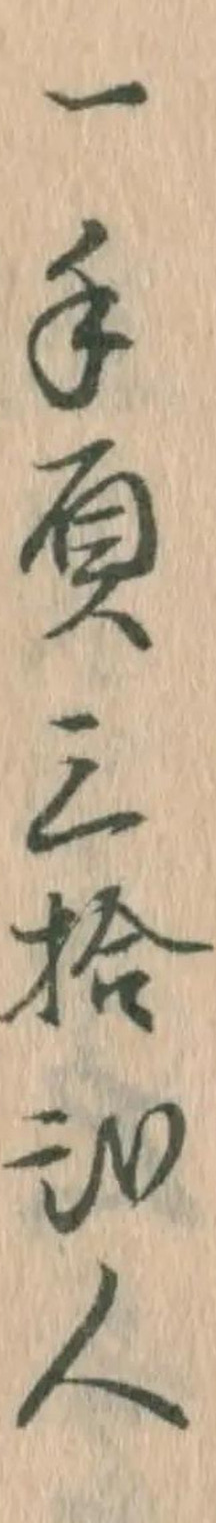一手負三拾弐人
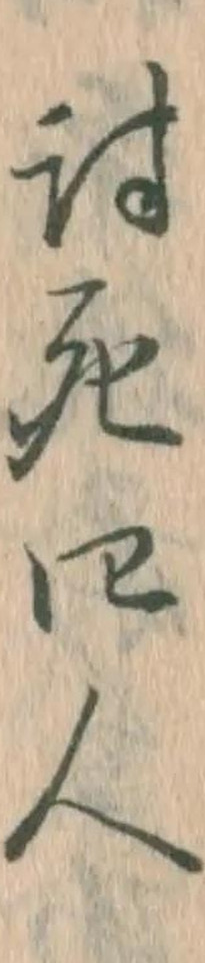討死四人
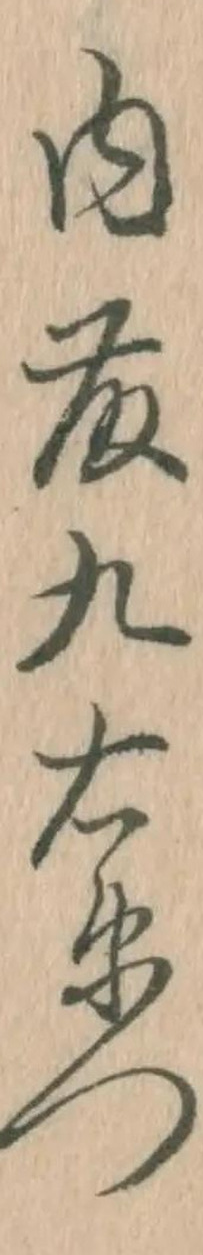内藤九右衛門
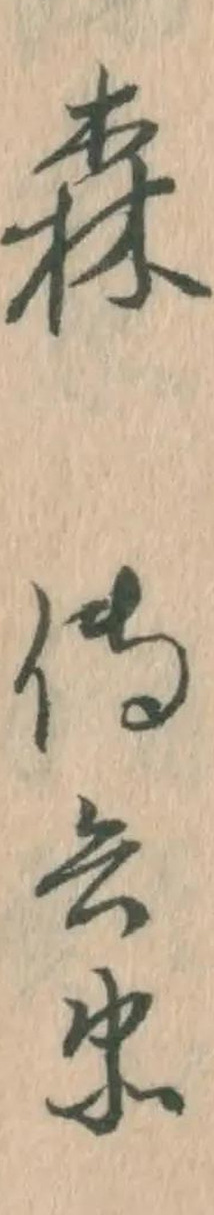森伝兵衛
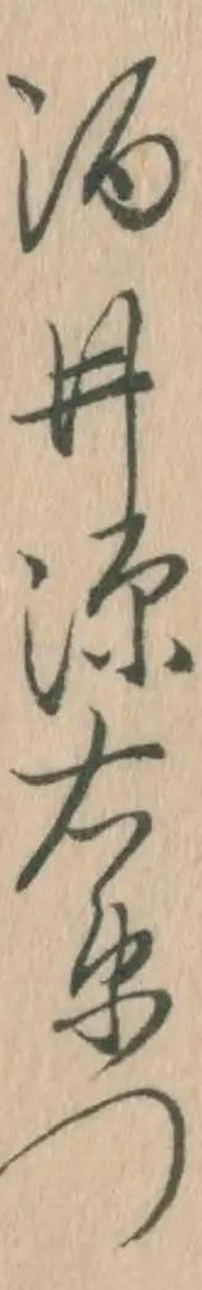酒井源右衛門
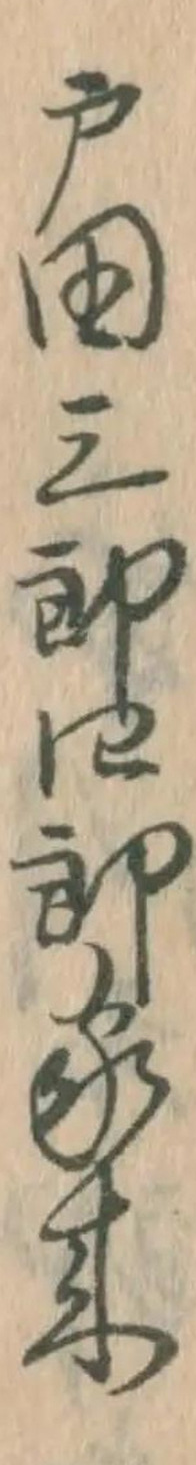戸田三郎四郎家来
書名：切支丹御退治記 49巻. [9]
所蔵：国立国会図書館 National Diet Library, JAPAN
